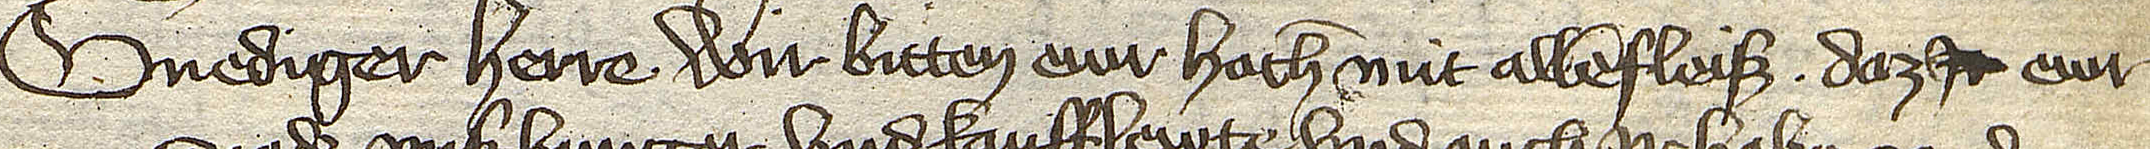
Gnediger herre Wir bitten ewr hoch* mit alle* fleiſʒ . daʒ Ir ewr
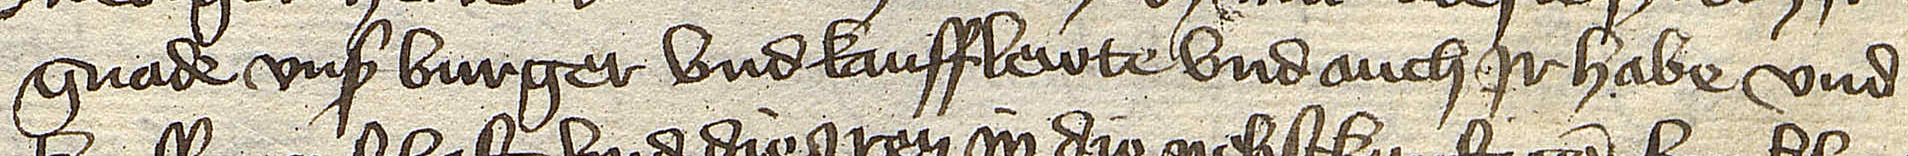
gnade vnſ* burger vnd kaufflewte vnd auch Ir habe vnd
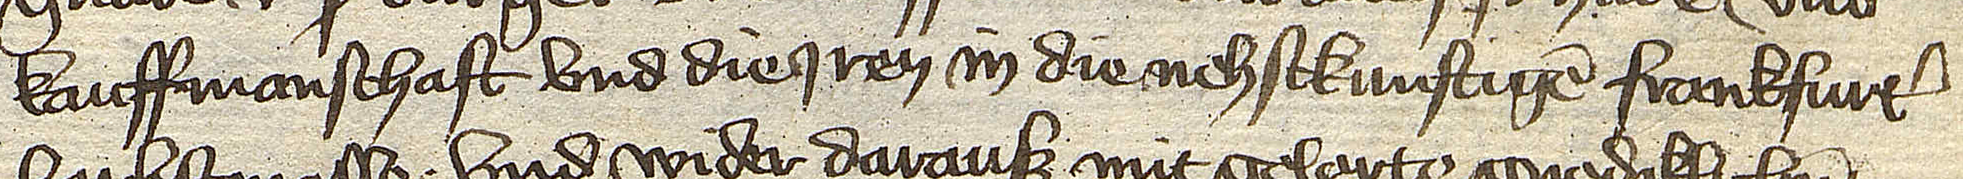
kauffmanſchaft vnd die Iren in die nehſtkunftige* frankfurt*
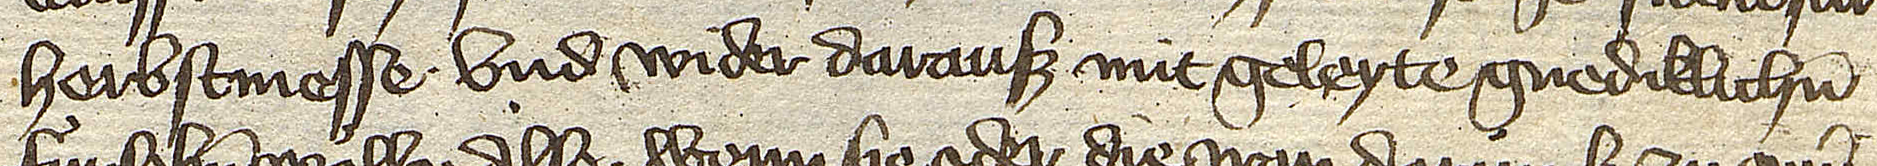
herbſmeſſe . vnd wider darauſʒ mit geleyte gnediklichn*
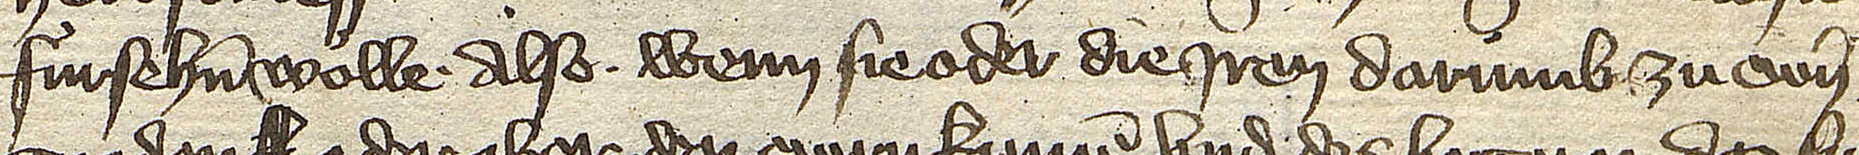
fürſehn* wölle . Alſo . wenn ſie oder die Iren darümb cʒu ew*n
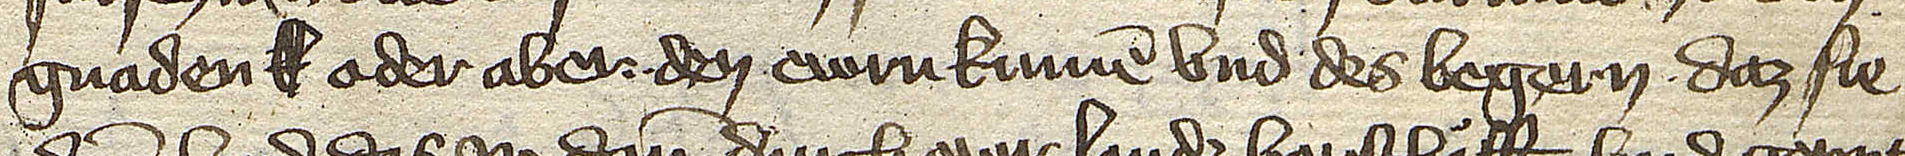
gnaden k oder aber ~ den ewrn kume* vnd des begern . daʒ ſie
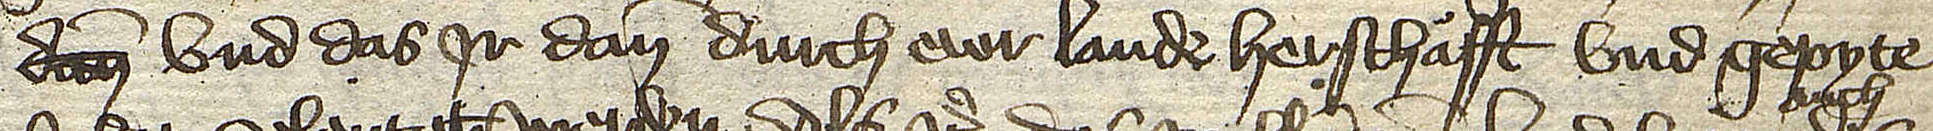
dan* vnd das Ir dan* durch ewr lande herſchäfft vnd gepyte
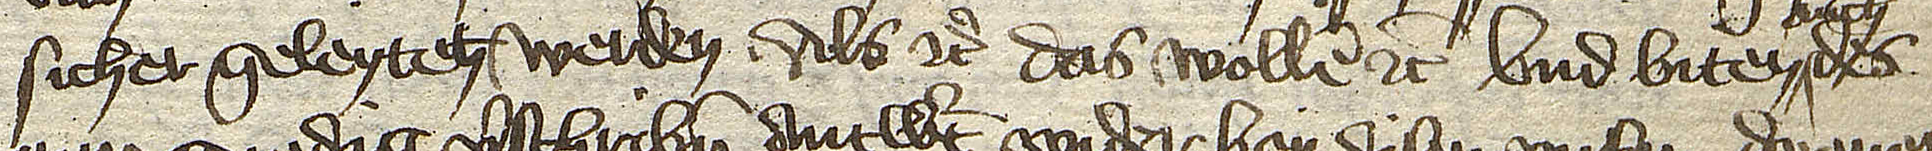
ſicher geleyten werden / Als ec* das wolle* ec* vnd biten des
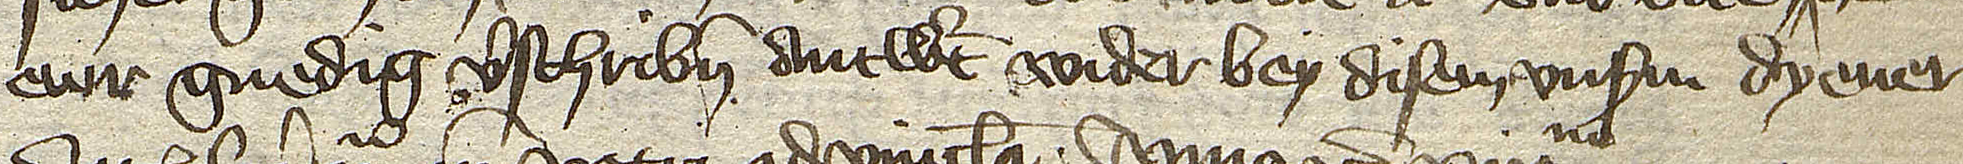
ewr gnedig v*ſchribn* Antw*t wider bey diſem vnſ*m dyener
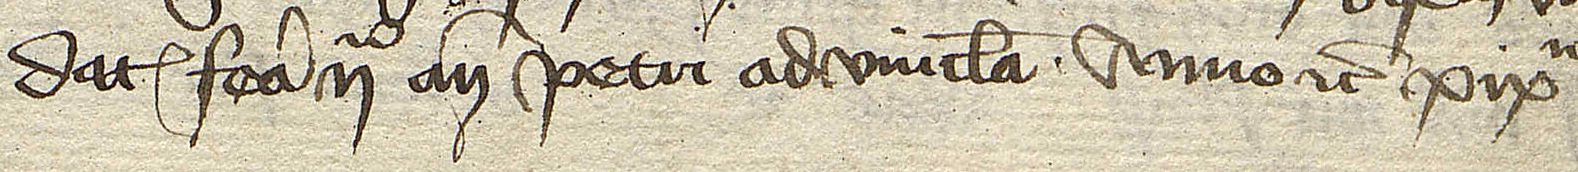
Dat* fea* ii* an* petri ad vincla* . Anno ec* xix*
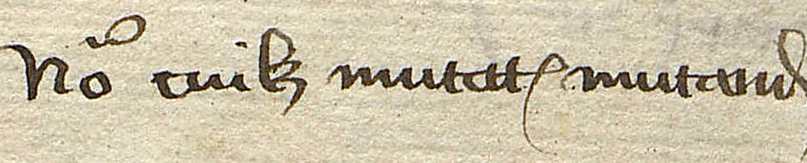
No* cuil* mutat* mutand*
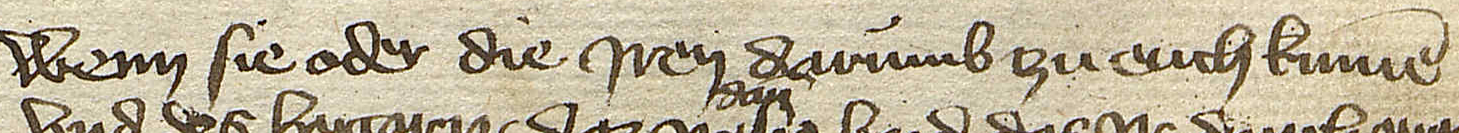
Wenn ſie oder die Iren darümb cʒu euch kume*
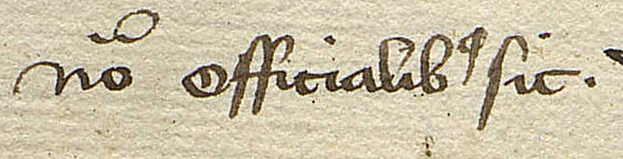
No* Officilib* ſic .
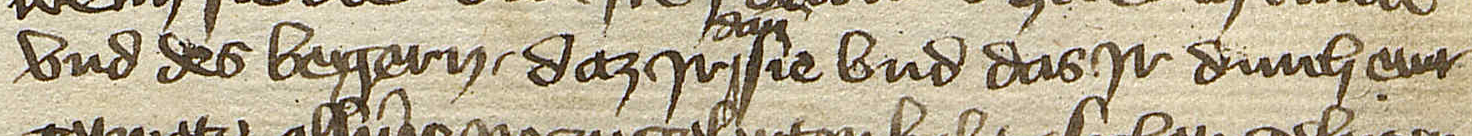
vnd des begern / daʒ Ir ſie vnd das Ir durch ewr
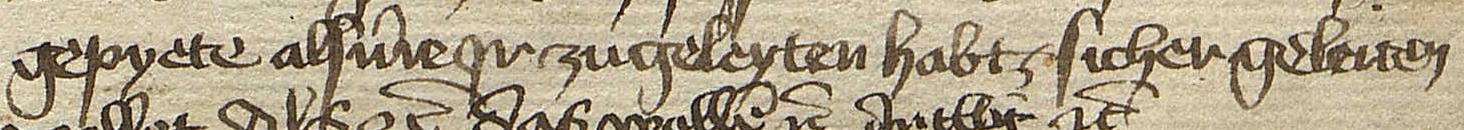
gepyete alſu*re Ir cʒugeleyten habt / ſicher geleiten
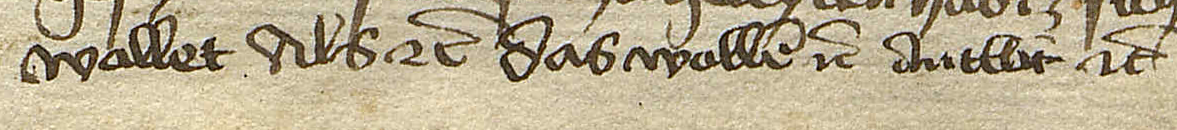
wollet Als ec* Das wolle* ec* Antw*t ec*
